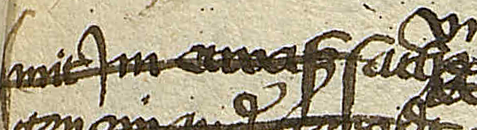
mit Im etwaſʒ ſachen
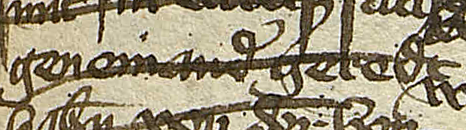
gen einand* geredt
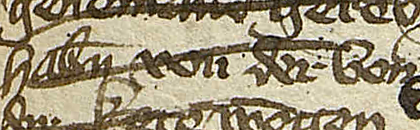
habn* von der von
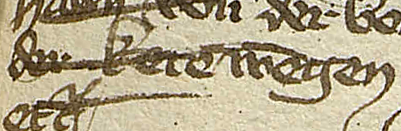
der kere wegen
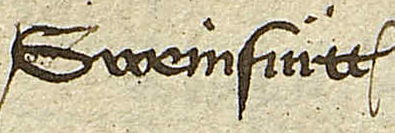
Sweinfürtt
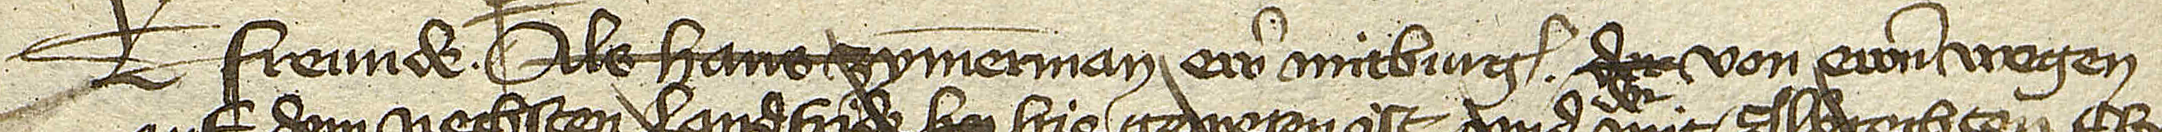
L* freunde . / Als hans cʒym*erman ew* mitburg* . der von ewn* wegen
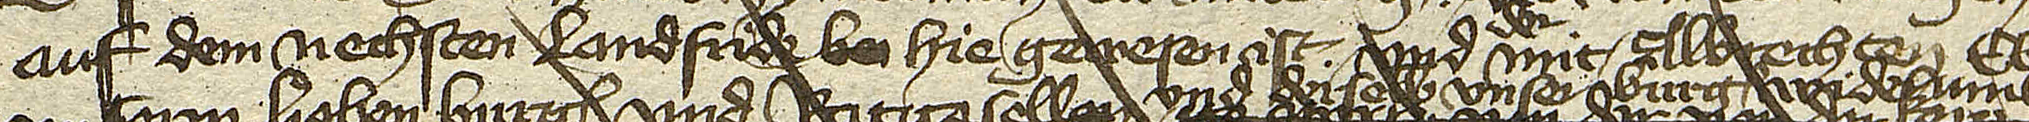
auf dem nechſten Landfride vo hie geweſen iſt . / vnd mit Albrechten Ebn*
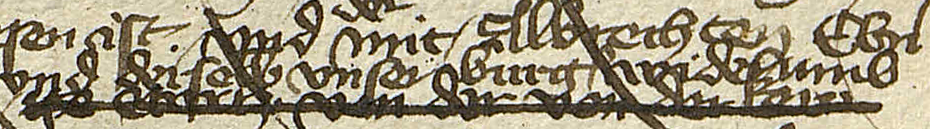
vnd derſelb vnſer burg* widervmb
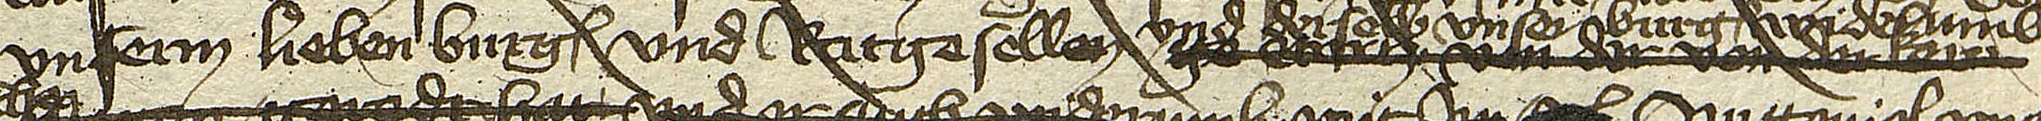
vnſerm lieben burg* vnd Ratgeſellen ge ewrn* von der von der kere
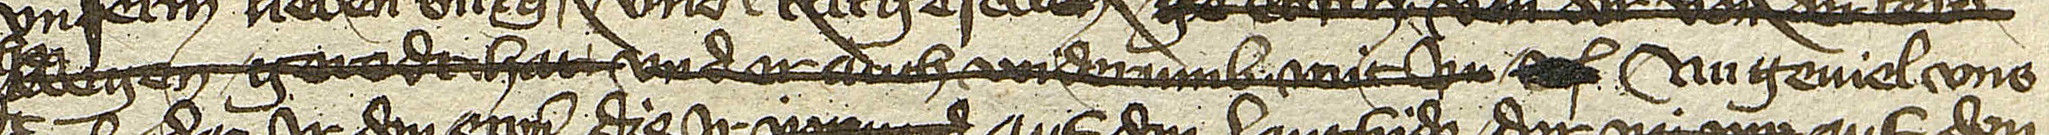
wegen geredt han* vnd er auch widerumb mit Im / ec* / Nu geuiel vns
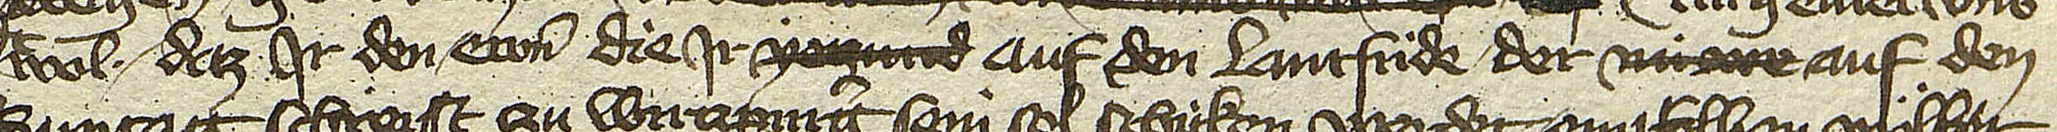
wol . / daʒ Ir den ewn* die Ir yecʒund auf den Lantfride / der nu we auf den
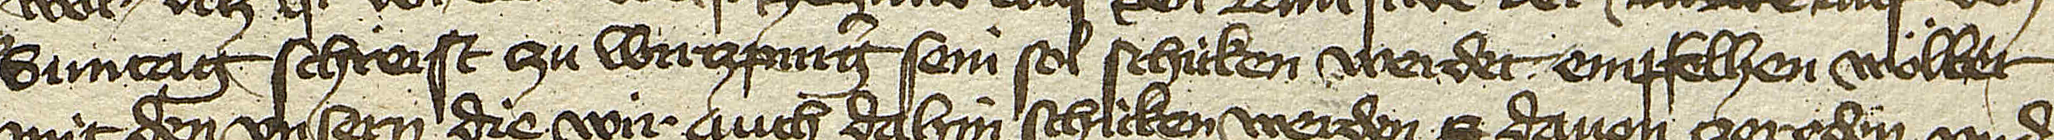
Suntag ſchierſt cʒu wircʒpurg* ſein ſol ſchicken werdet . / empfelhen wöllet
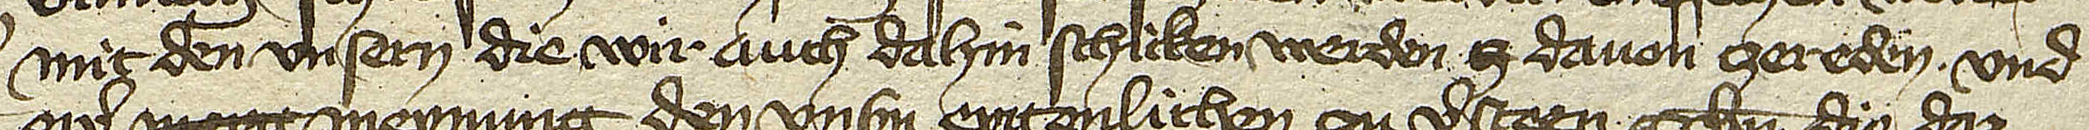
mit den vnſern die wir auch dahin ſchicken werden cʒ dauon cʒereden . vnd
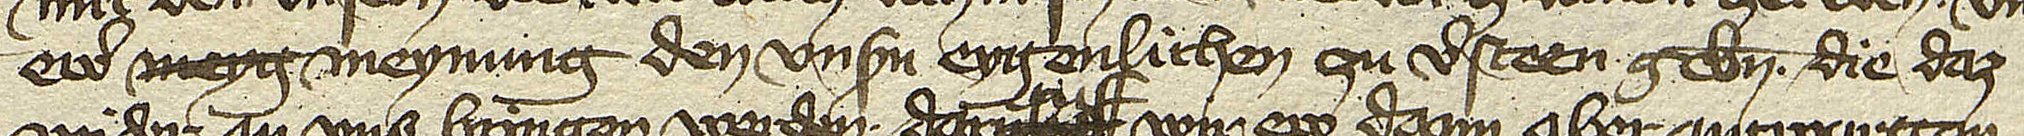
ew* meyg meynung den vnſ*n eygenlichen cʒu v*ſteen gebn* . / die daʒ
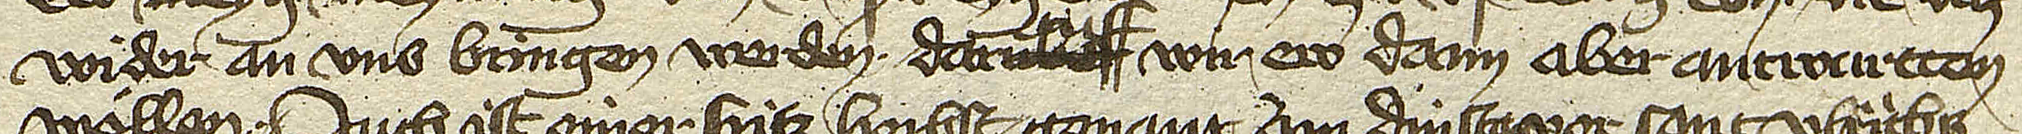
wider an vns bringen werden . / daruber wir ew dann aber antwurtten
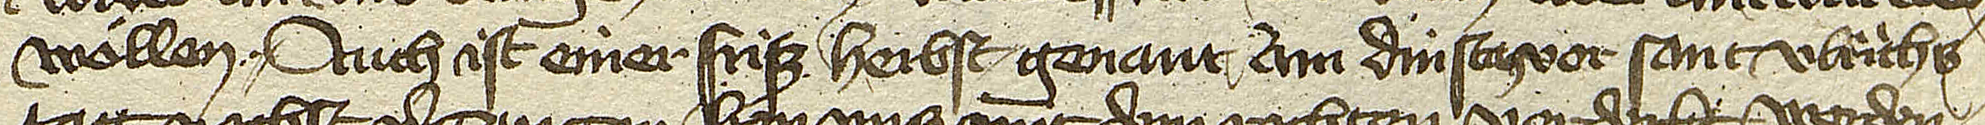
wöllen . / Auch iſt einer friſʒ herbſt genant am dinſtag vor ſant vlrichs
